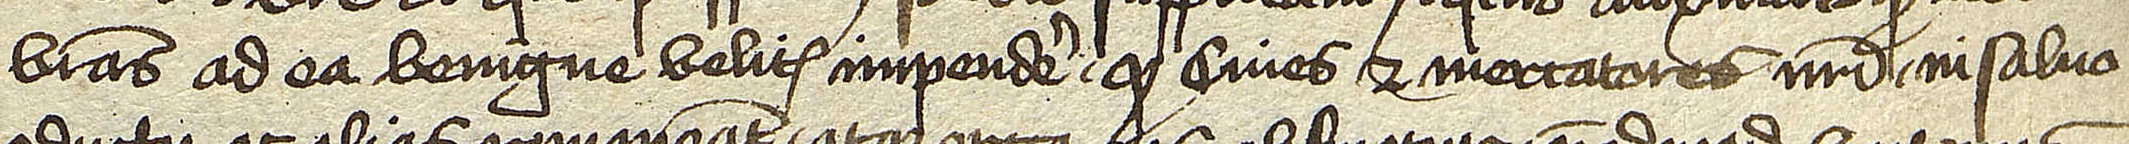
v*ras ad ea benigne velit* impende* / q* Ciues @ mercatores n*ri / in ſaluo
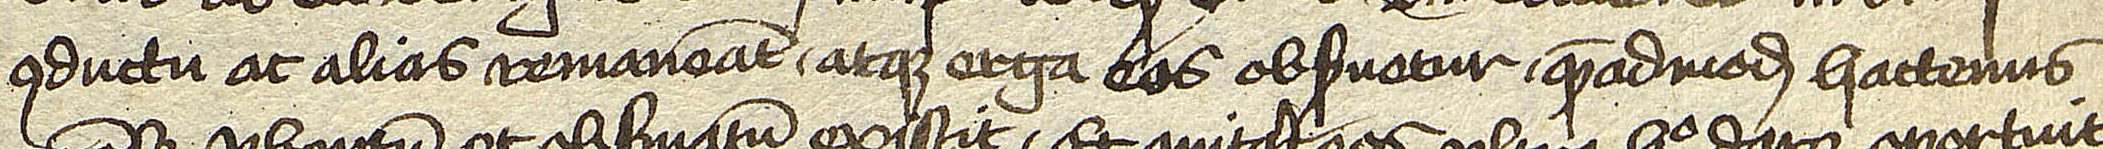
*ductu ac alias remanea*t / atq* erga eos obſ*uetur / q*admod* hactenus
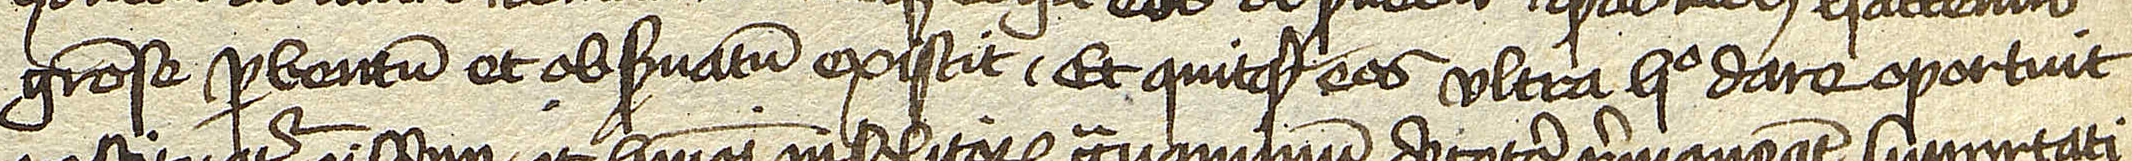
g*r*oſe p*bentu* et obſ*uatu* exiſtit / Et quicq* eos vltra h* dare oportuit
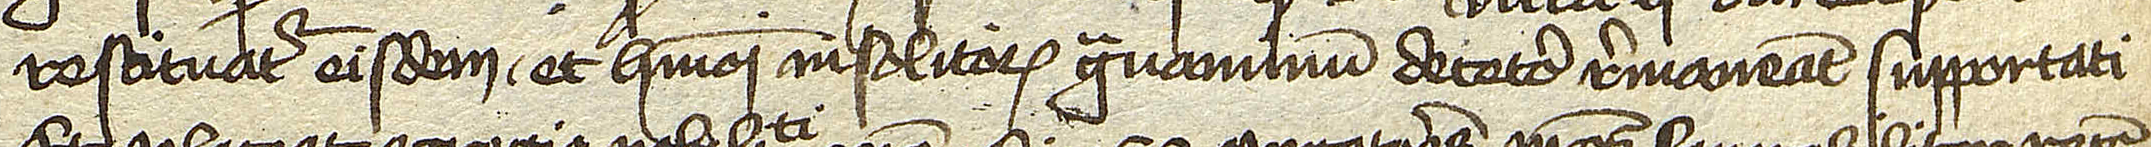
reſtituat* eiſdem / et h*mo*i in ſolito* g*uaminu* dec*eto r*manea*t ſupportati
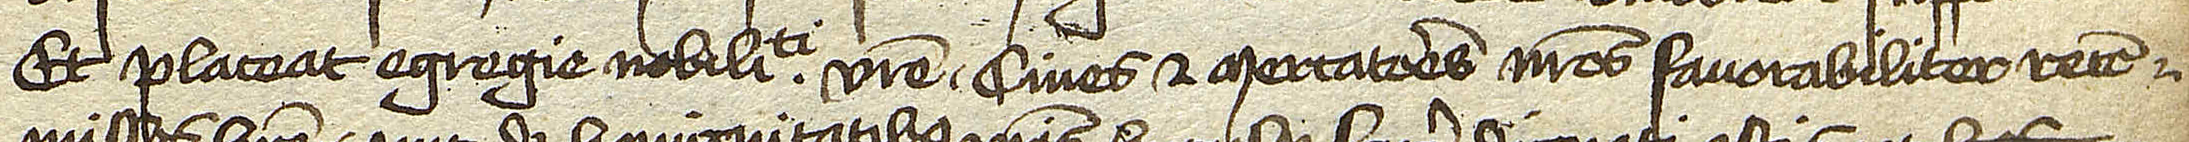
Et placeat egregie nobili*ti . v*re / Ciues @ Mercato*es n*ros fauorabiliter rec* =
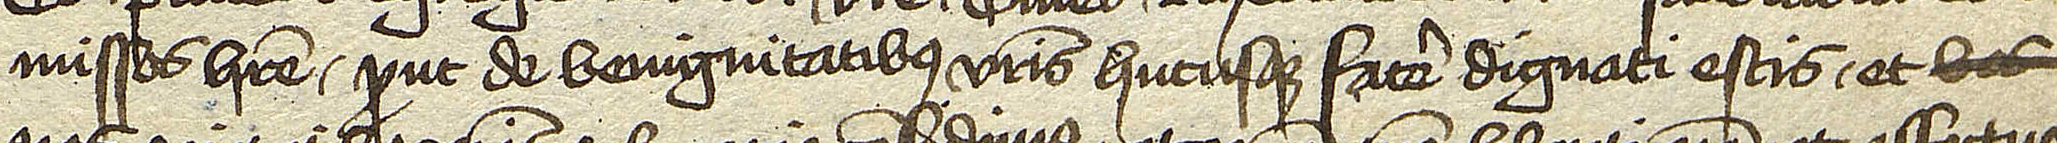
miſſos h*re / P*ut de benignitatib* v*ris huiusq* face* dignati eſtis / et vos
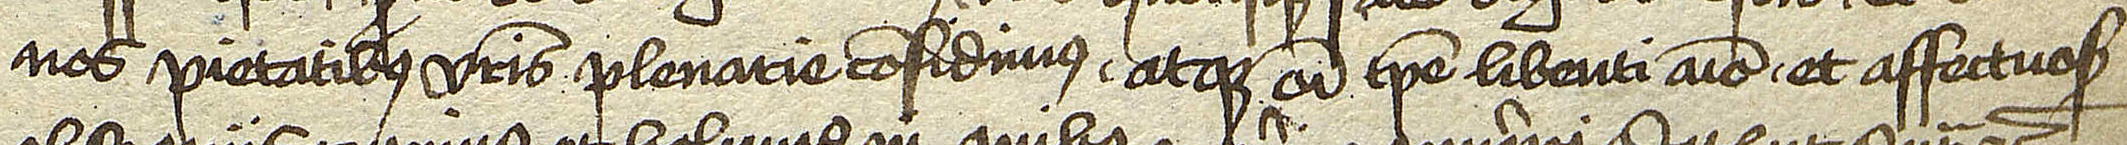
nos pietatib* v*ris plenarie co*fidim* / atq* o*i t*p*e libenti a*i*o / et affectuq*
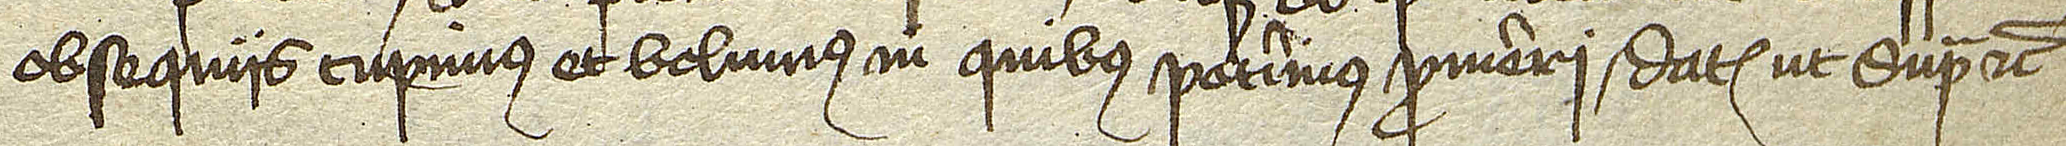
obſequiis cupim* et volum* in quib* potu*m* p*meri / Dat* ut Sup* ec*
